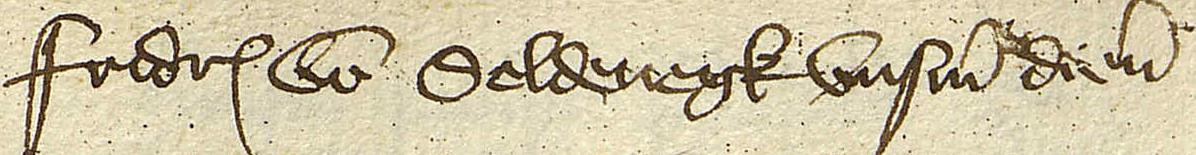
fridr* vo* Seldenegk vnſm* dien*
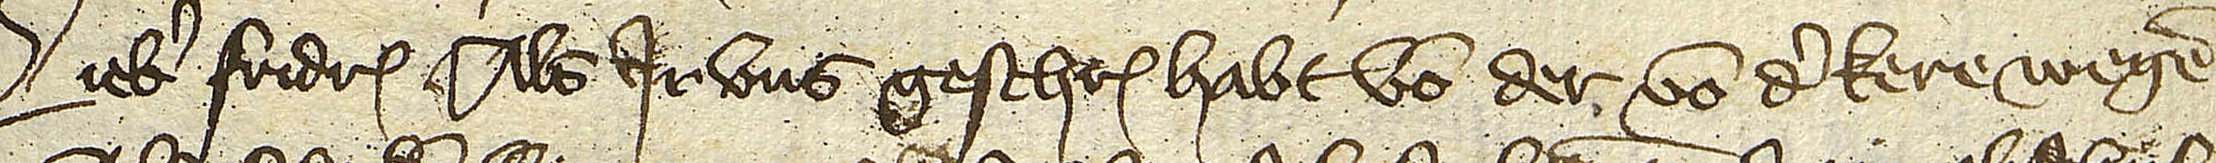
Lieb* fridr* / Als Ir vns geſchr* habt vo* d* kere wege*
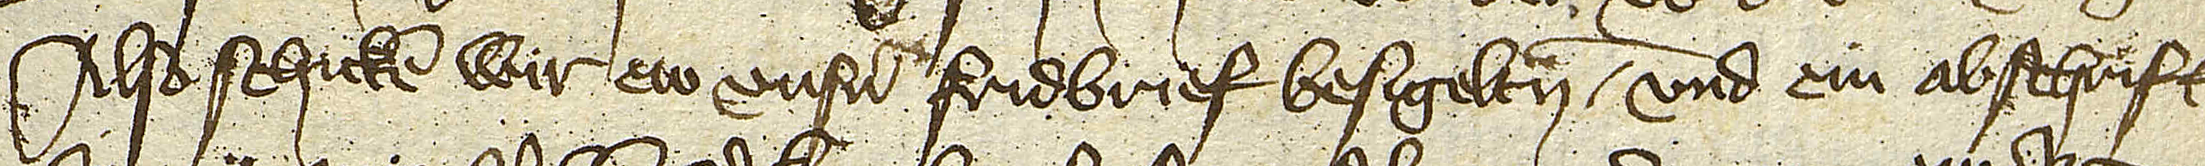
Alſo ſchicke* wir ew vnſn* fridbrief beſigeltn* / vnd ein abſchrift
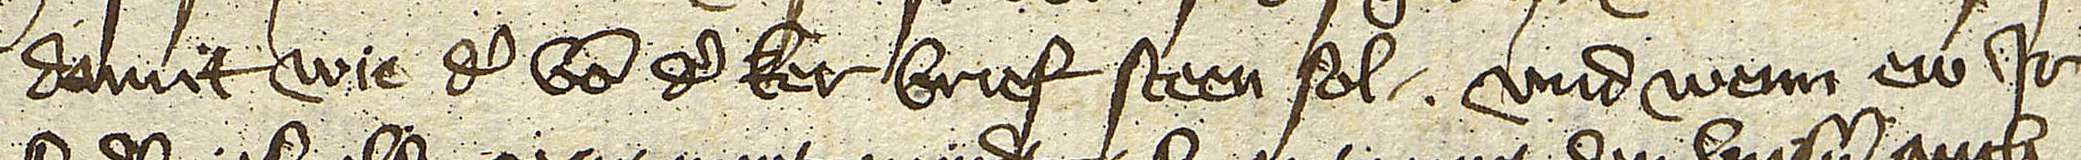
damit wie d* vo* d* ker brief ſteen ſol / . vnd wenn ew Ir
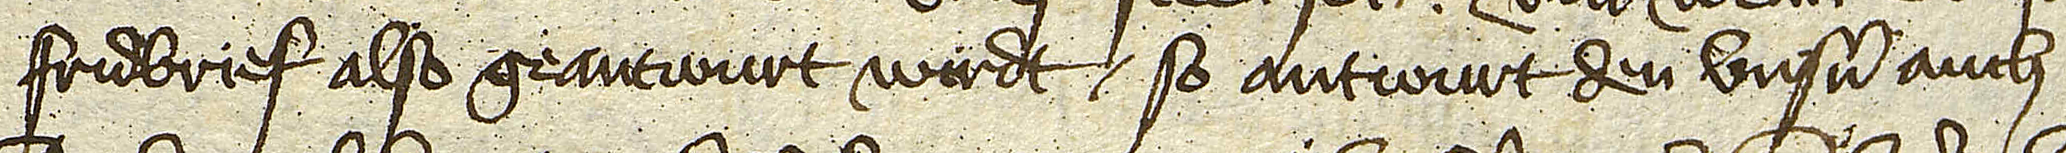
fridbrief alſo geantwurt wirdt / ſo antwurt den vnſn* auch
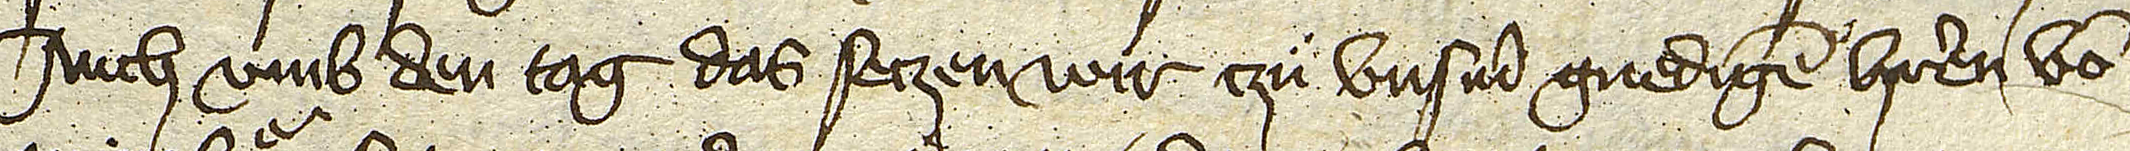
Auch vmb den tag das ſecʒen wir cʒü vnſm* gnedige* hr*en vo*
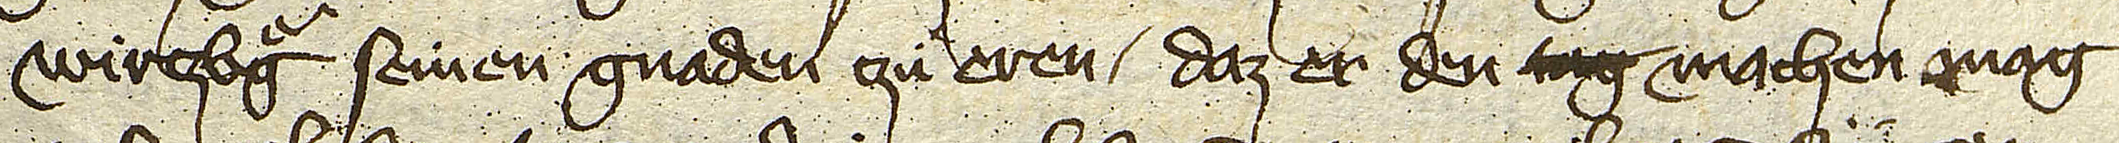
wircʒb*g ſeinen gnaden cʒü eren / daʒ er den tag machen mag
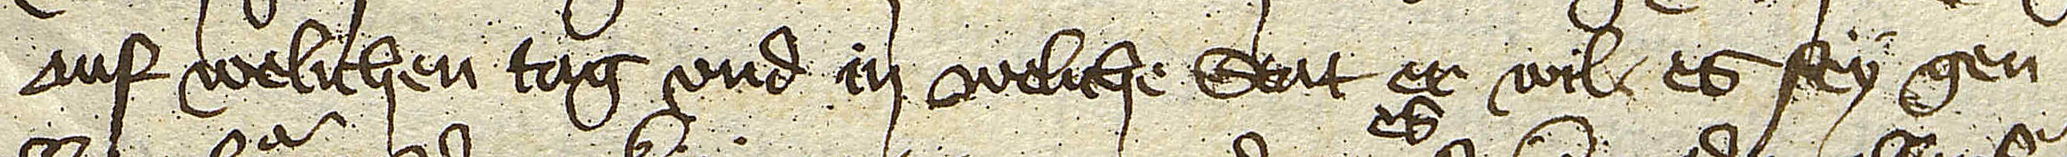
auf welichen tag vnd in weliche Stat er wil / es ſey gen
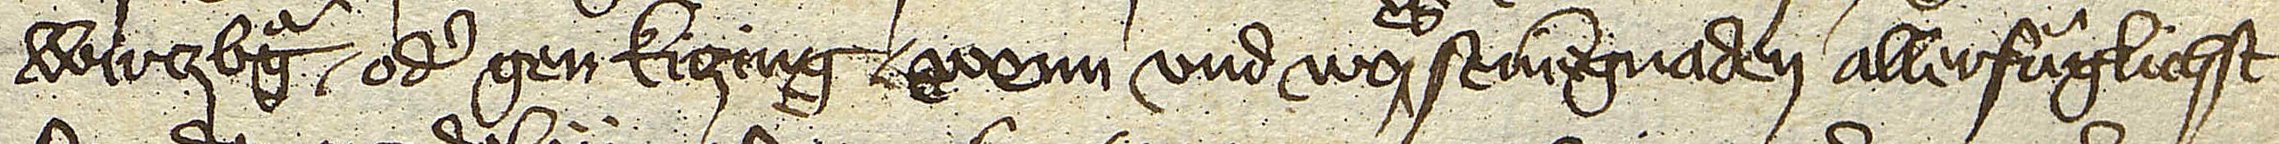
wircʒb*g / od* gen Kicʒing / wenn vnd wo ſeine* gnaden allerfüglichſt
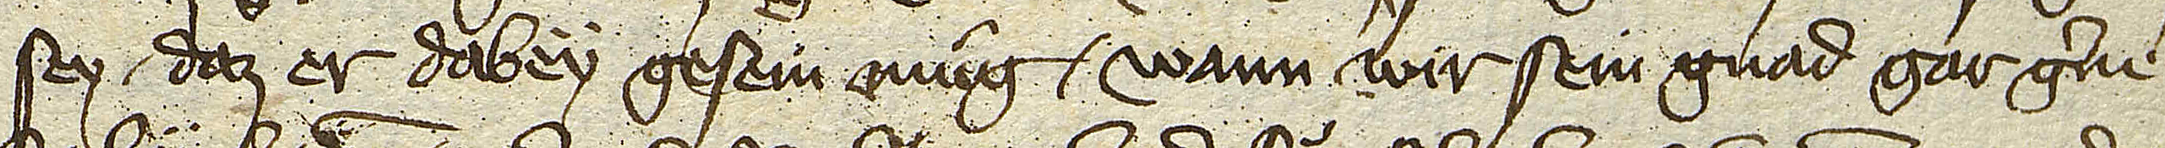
ſey / daʒ er dabey geſein müg / wann wir ſein gnad gar g*ne
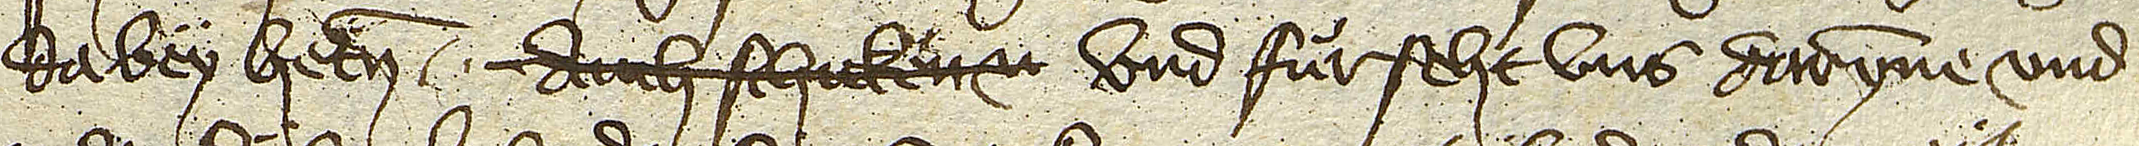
dabey hetn* / . Auch ſchicken n vnd für vns daryne* vnd
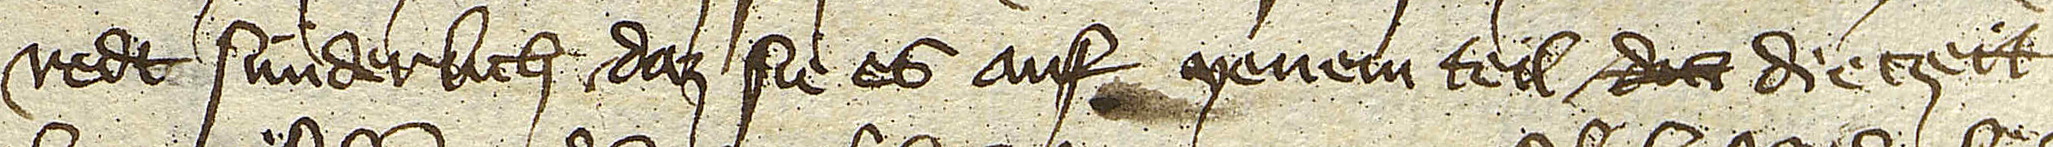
redt ſünderlich / daʒ ſie es auf yenem teil / dicʒ die cʒeit
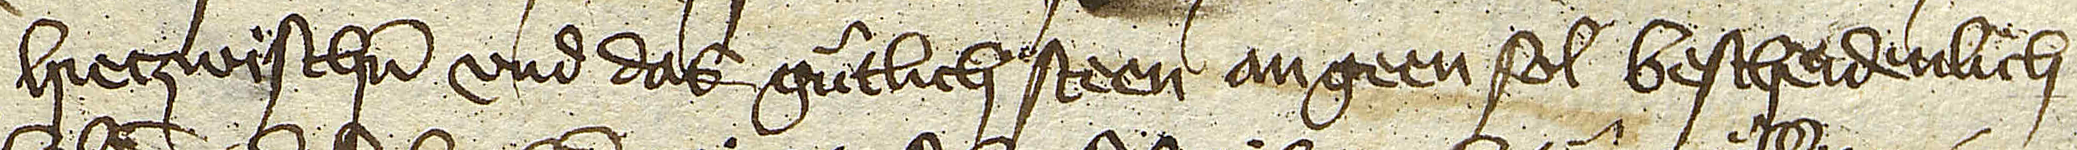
hiecʒwiſchn* vnd das gütlich ſteen angeen ſol beſcheidenlich
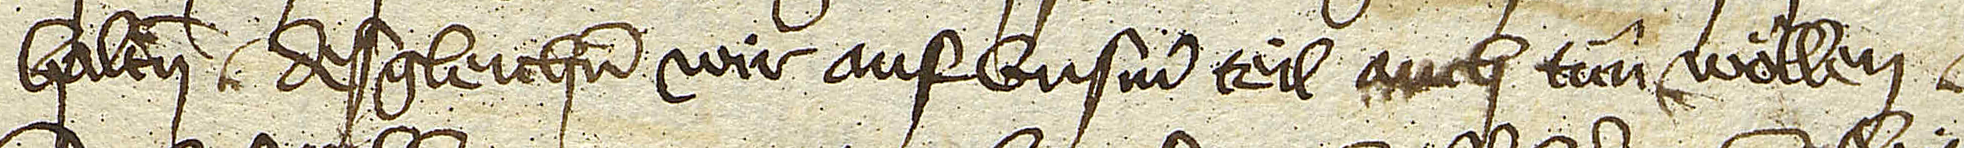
haltn* / deſgleichn* wir auf vnſm* teil auch tün wöllen /
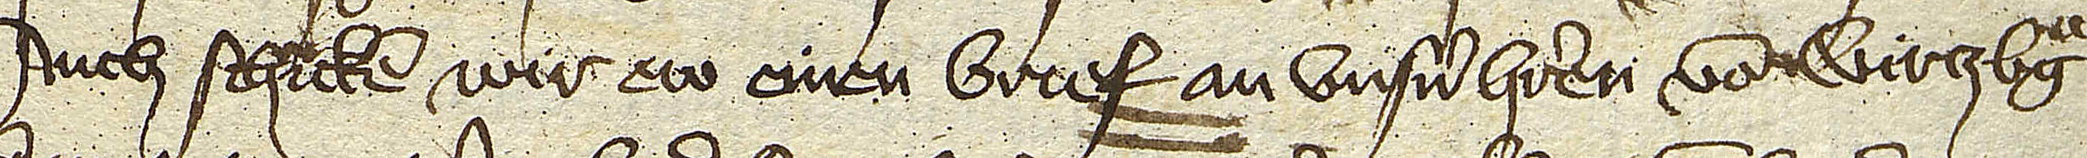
Auch ſchicke* wir ew eine brief an vnſn hr*en vo* wircʒb*g
